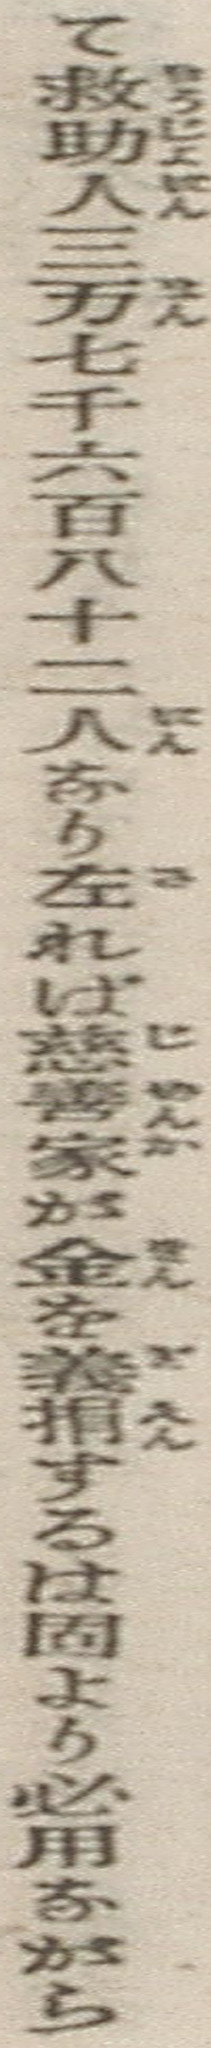て救助人三万七千六百八十二人なり左れば慈善家が金を義捐するは固より必用ながら
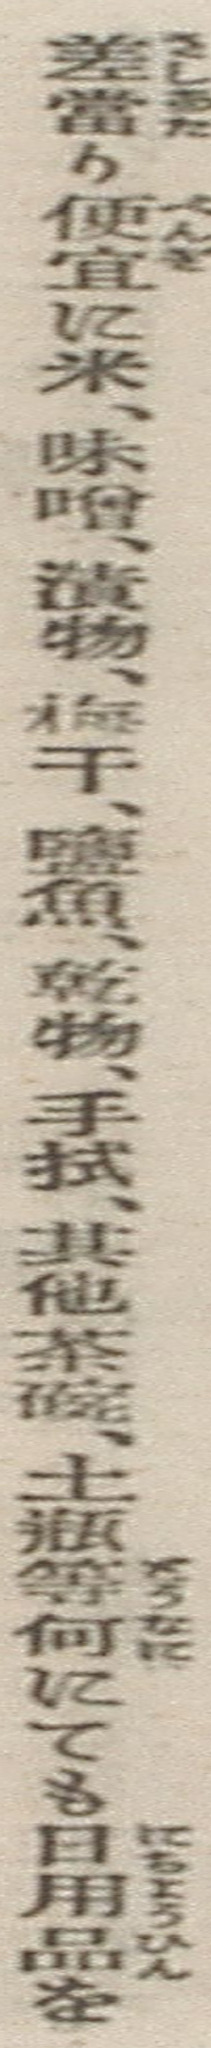差当り便宜に米、味噌、漬物、梅干、塩魚、乾物、手拭、其他茶碗、土瓶等何にても日用品を
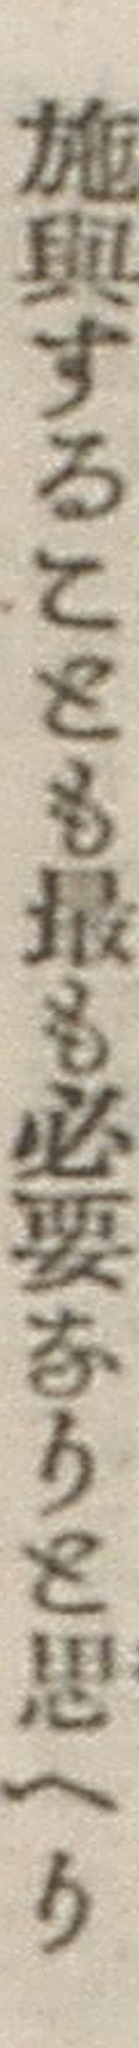施与することも最も必要なりと思へり
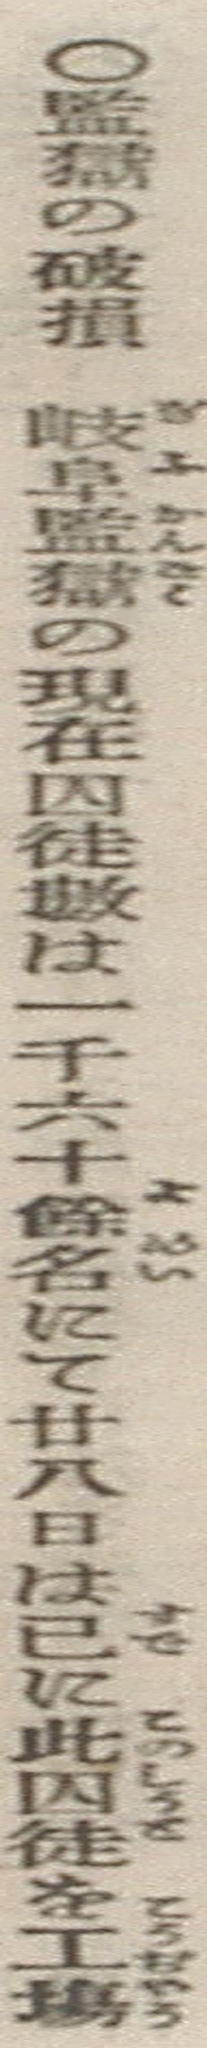○監獄の破損岐阜監獄の現在囚徒数は一千六十余名にて廿八日は已に此囚徒を工場
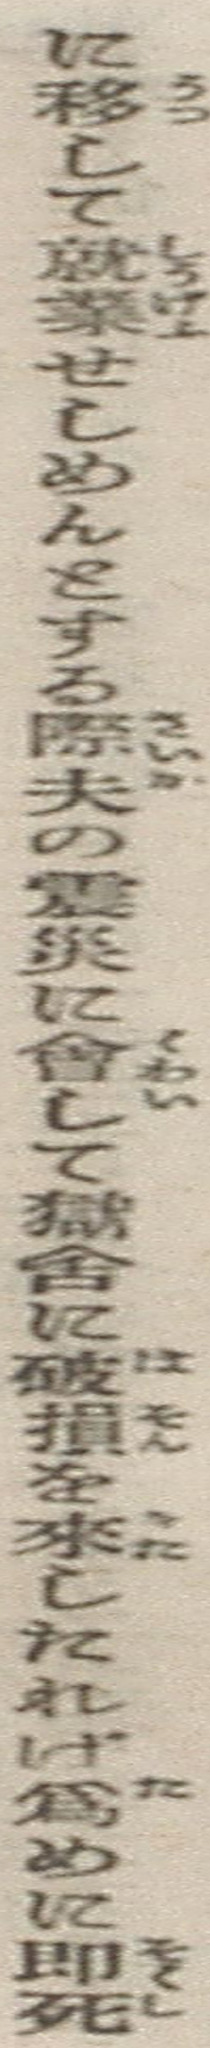に移して就業せしめんとする際夫の震災に会して獄舎に破損を来したれば為めに即死
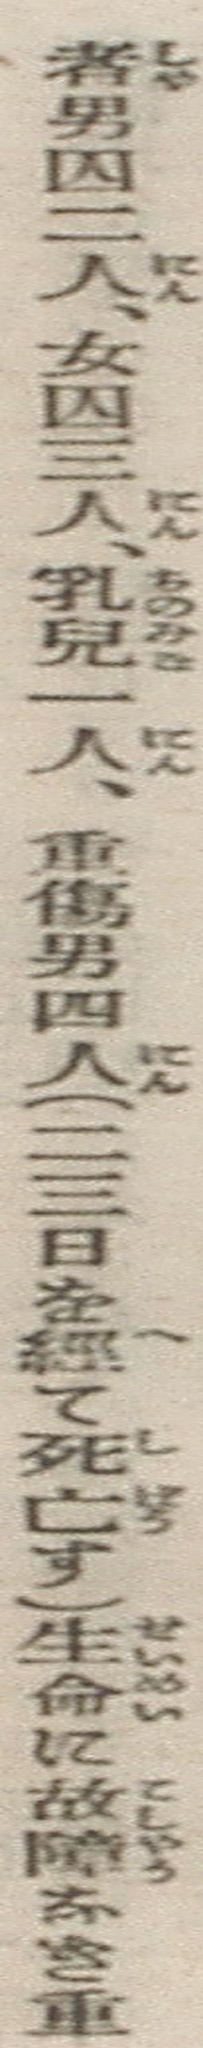者男囚二人、女囚三人、乳児一人、重傷男四人て死亡す）生命に故障なき重
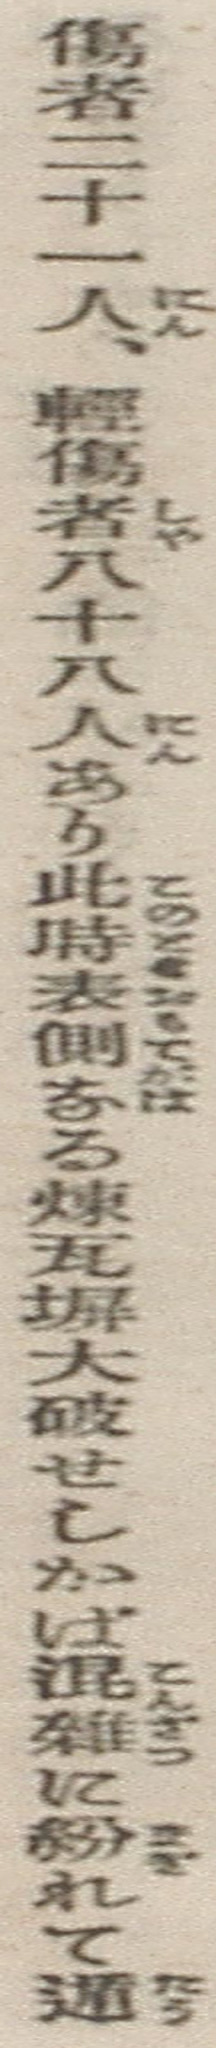傷者二十一人、軽傷者八十八人あり此時表側なる煉瓦塀大破せしかば混雑に紛れて遁
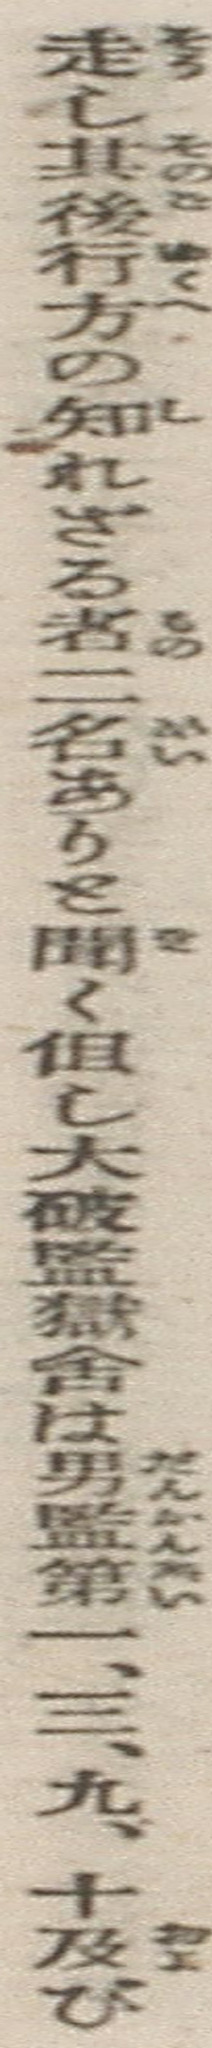走し其後行方の知れざる者二名ありと聞く但し大破監獄舎は男監第一、三、九、十及び
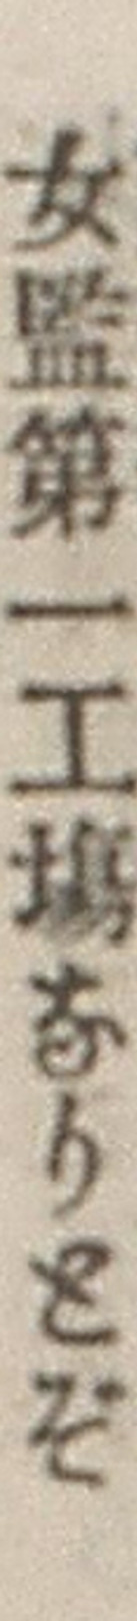女監第一工場なりとぞ
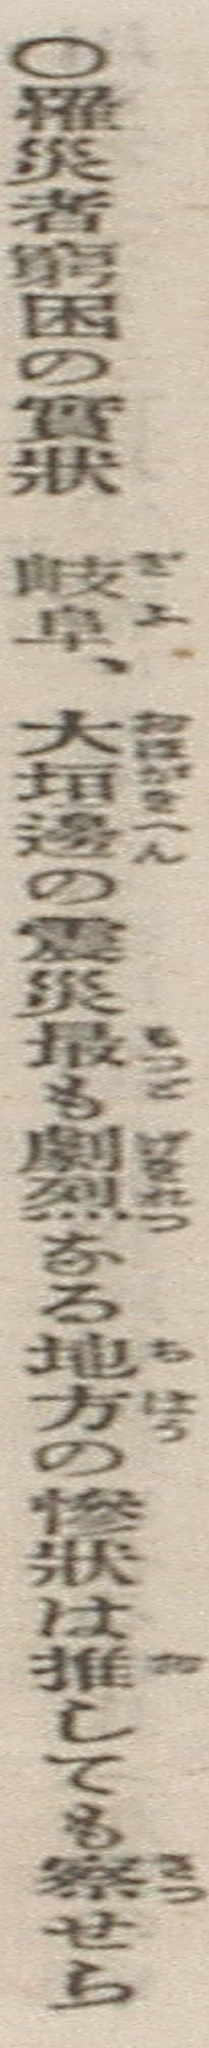○罹災者窮困の実状岐阜、大垣辺の震災最も劇烈なる地方の惨状は推しても察せら
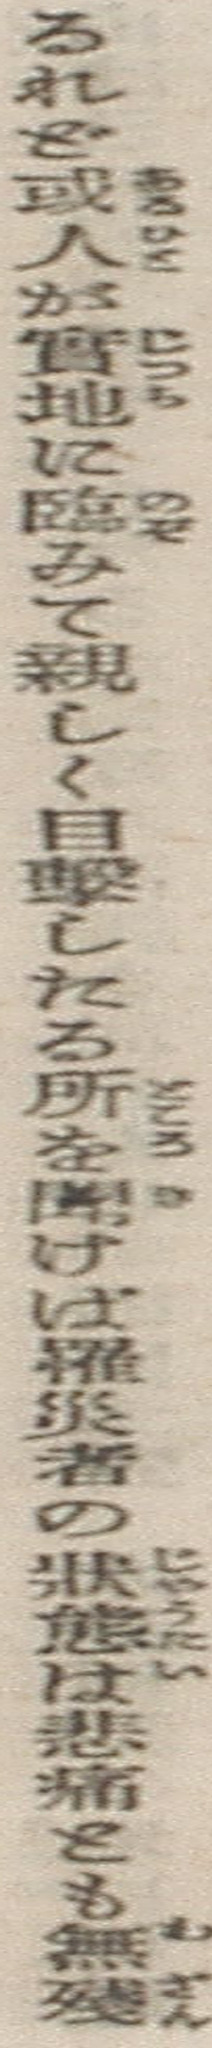るれど或人が実地に臨みて親しく目撃したる所を聞けば罹災者の状態は悲痛とも無残
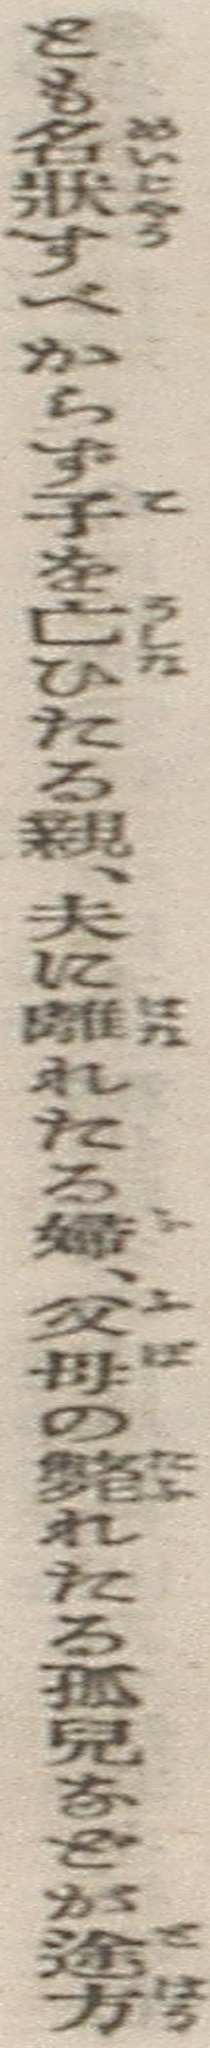とも名状すべからず子を亡ひたる親、夫に離れたる婦、父母の斃れたる孤児などが途方
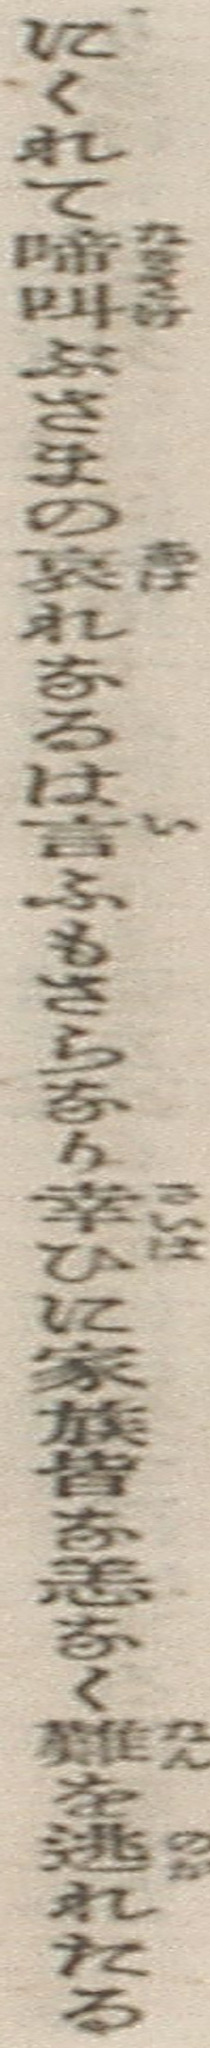にくれて啼叫ぶさまの哀れなるは言ふもさらなり幸ひに家族皆な恙なく難を逃れたる
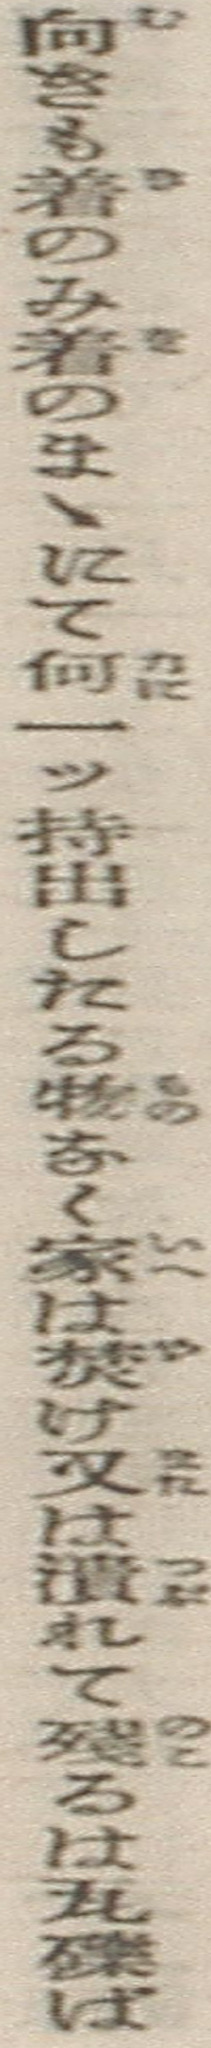向きも着のみ着のまゝにて何一ッ持出したる物なく家は焚け又は潰れて残るは瓦礫ば
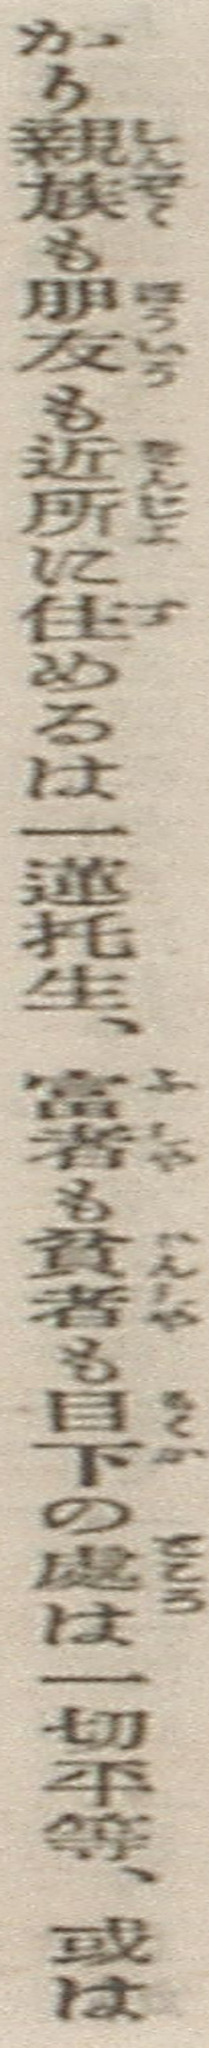かり親族も朋友も近所に住めるは一蓮托生、富者も貧者も目下の処は一切平等、或は
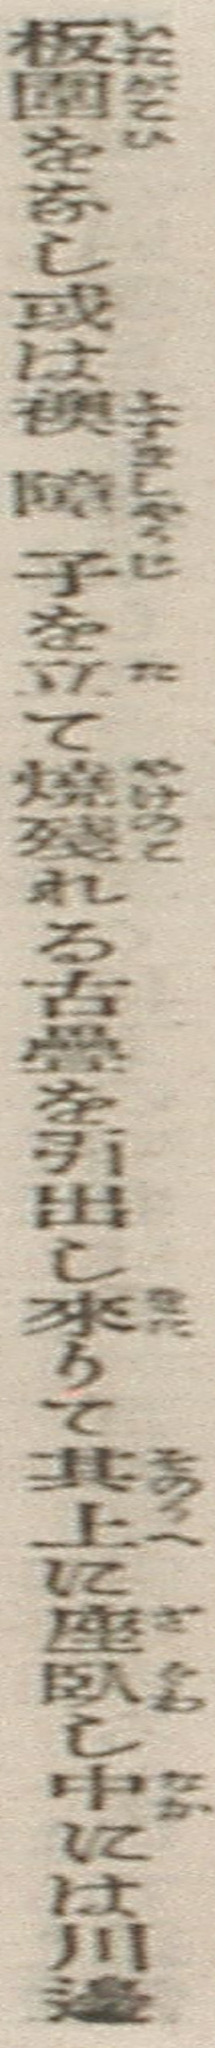板囲をなし或は襖障子を立て焼残れる古畳を引出し来りて其上に座臥し中には川辺
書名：愛知岐阜福井三県　大地震見聞録（内題）
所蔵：東京大学地震研究所図書室 Earthquake Research Institute Library, The University of Tokyo, JAPAN
